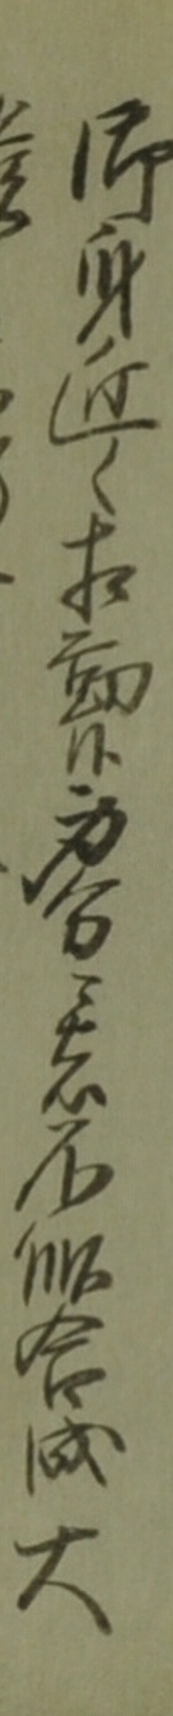御身近道々相勤候身分ニ者不似合成大
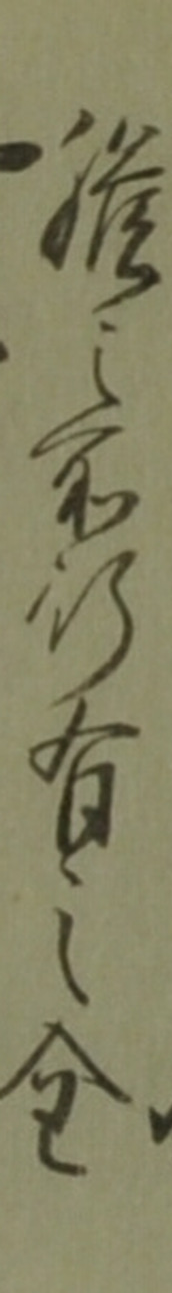胆之所行有之全
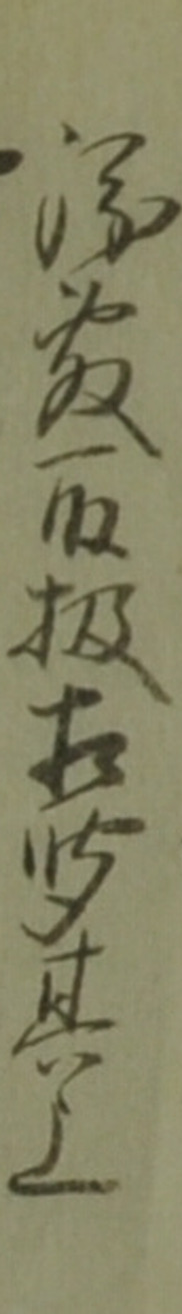紛敷取扱相聞其上
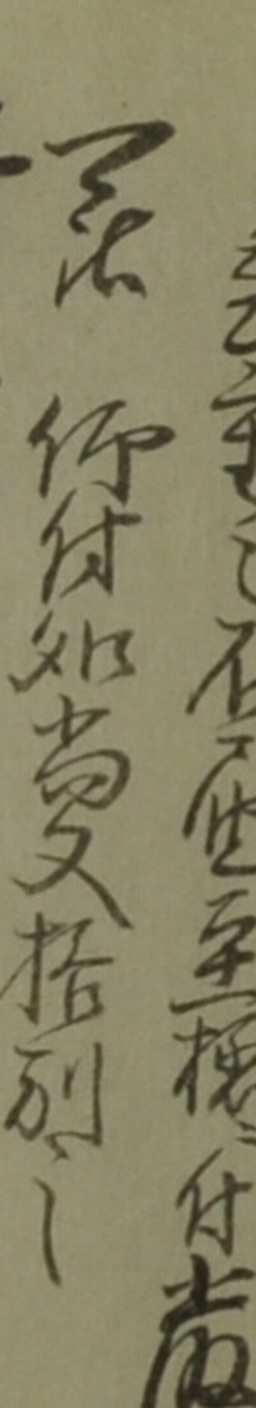可被仰付処尚又格別野
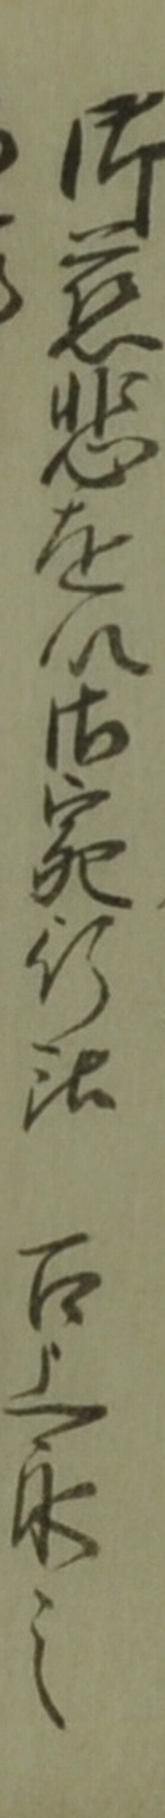御慈悲を以御宛行被召上永之
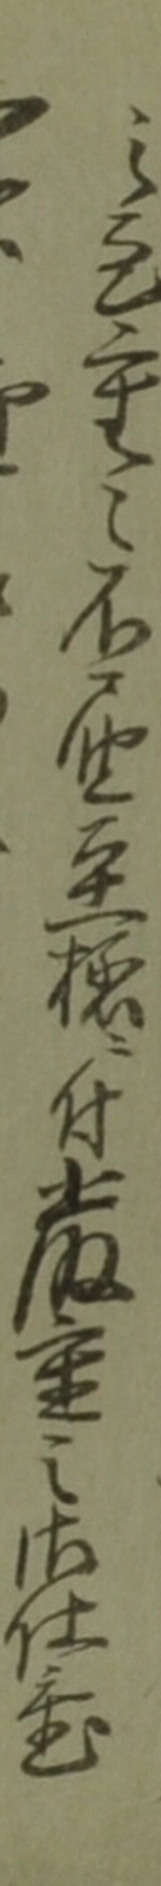之至重々不届至極ニ付厳重之御仕置
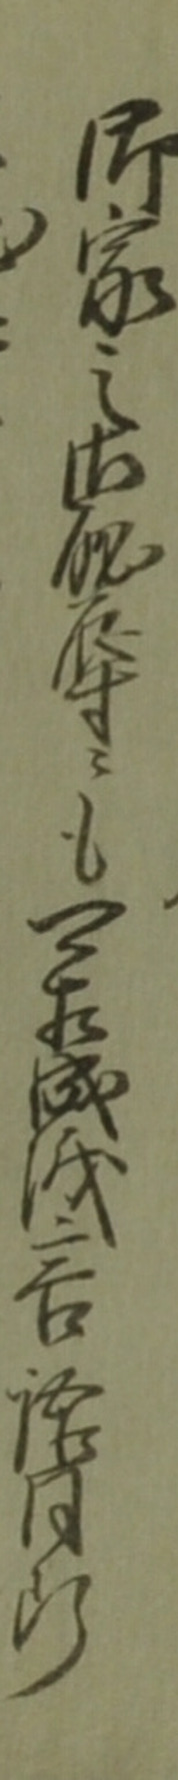御家之御恥辱ニも可相成儀ニ言語同断
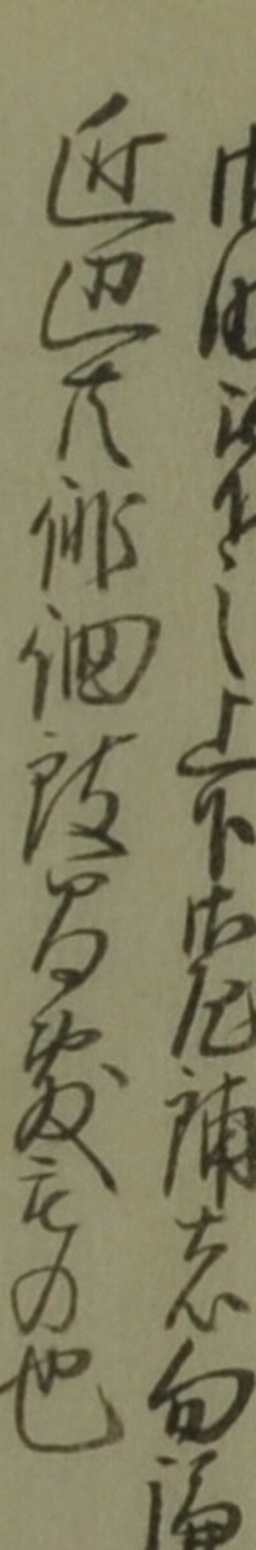近辺共徘徊致間敷もの也
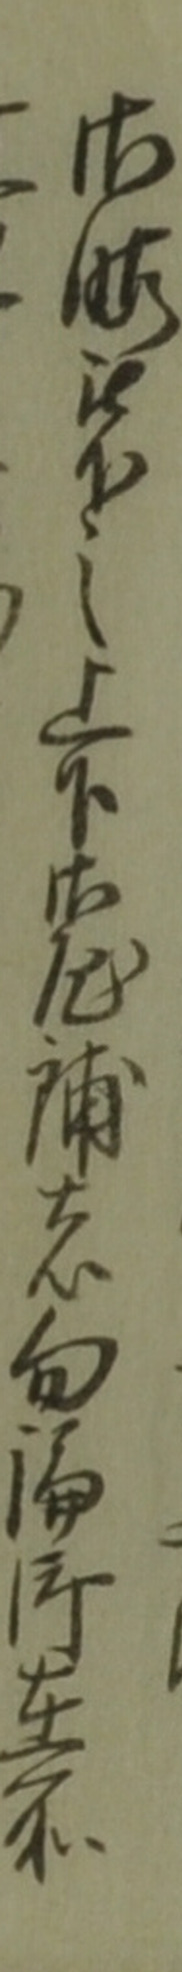御暇被下之上下御屋敷者勿論御在所
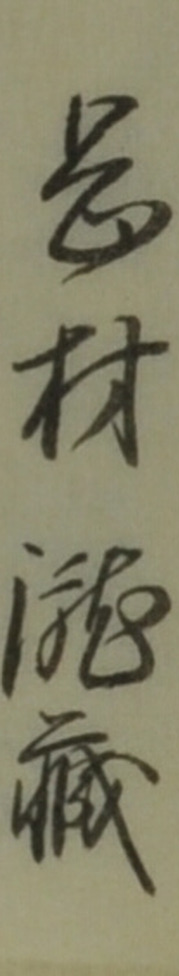岡村瀧蔵
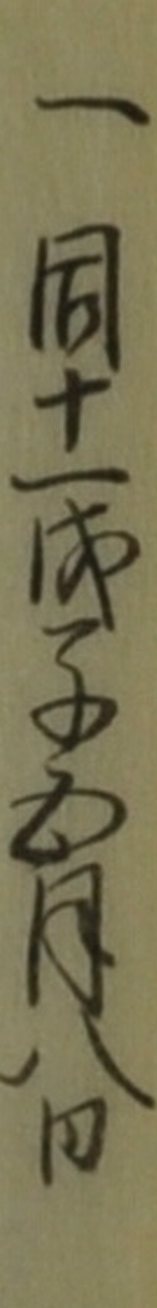一同十一戌子五月八日
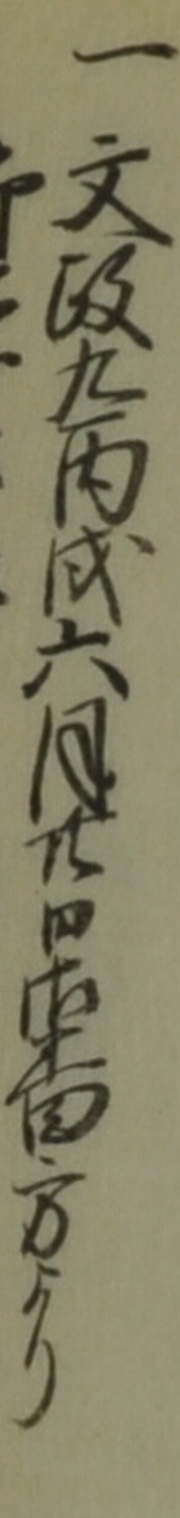一文政九丙戌六月廿日御番方より
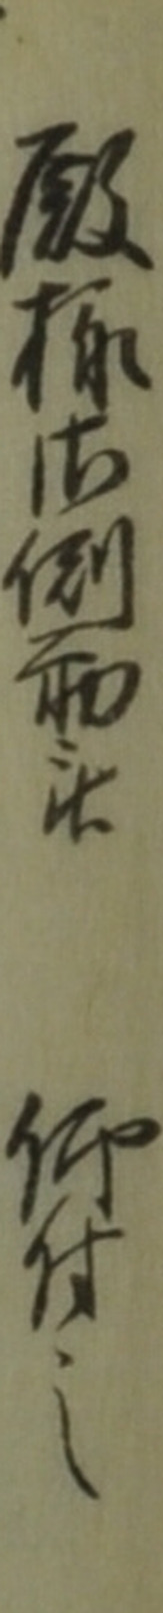殿様御側勤被仰付之
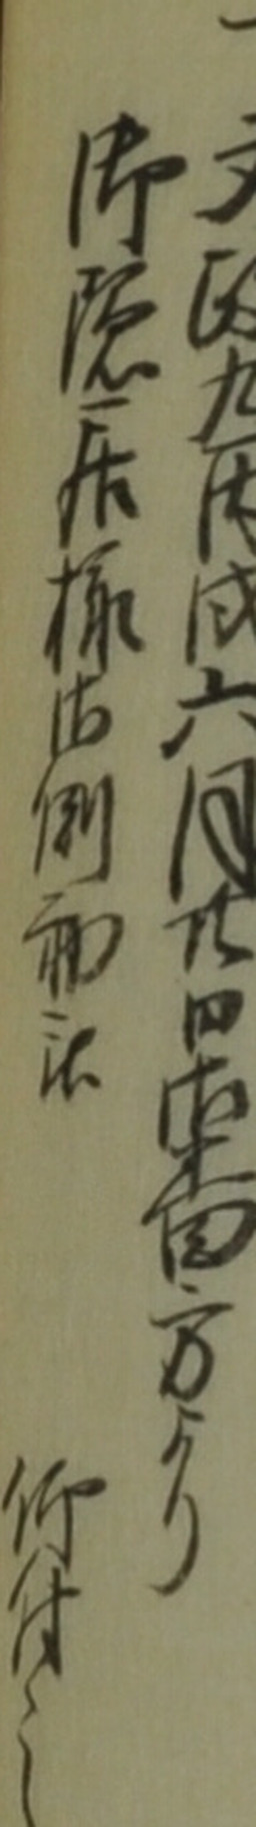御隠居様御側勤被仰付之
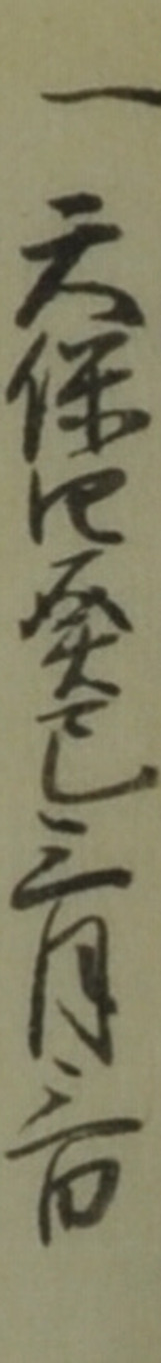一天保四癸巳三月三日
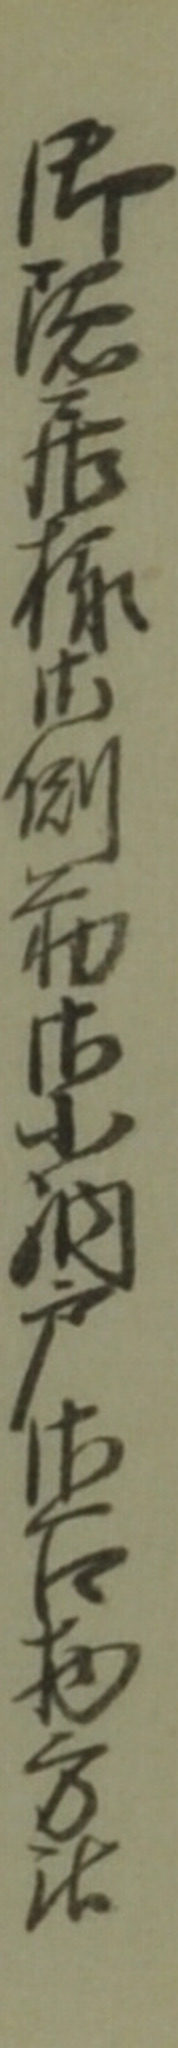御隠居様御側勤御小納戸御召物方被
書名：諸御役代々録（五）
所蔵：伊那市立高遠町図書館・合同会社AMANE
